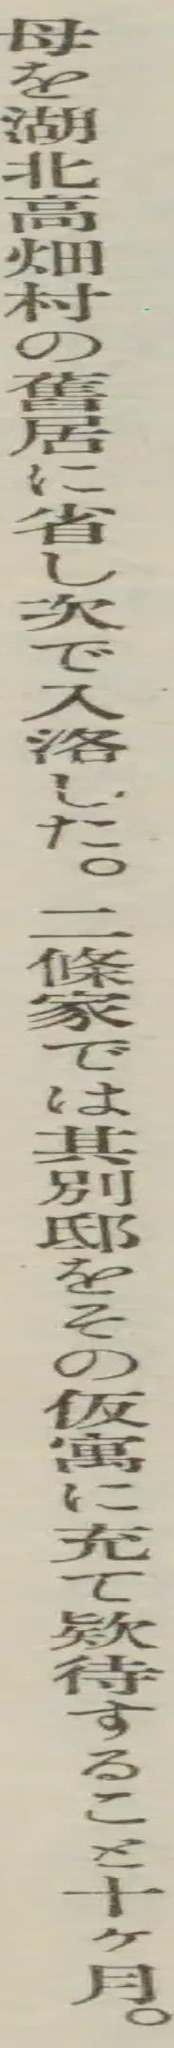母を湖北高畑村の旧居に省し次で入洛した。二條家では其別邸をその仮寓に充て款待すること十ヶ月。
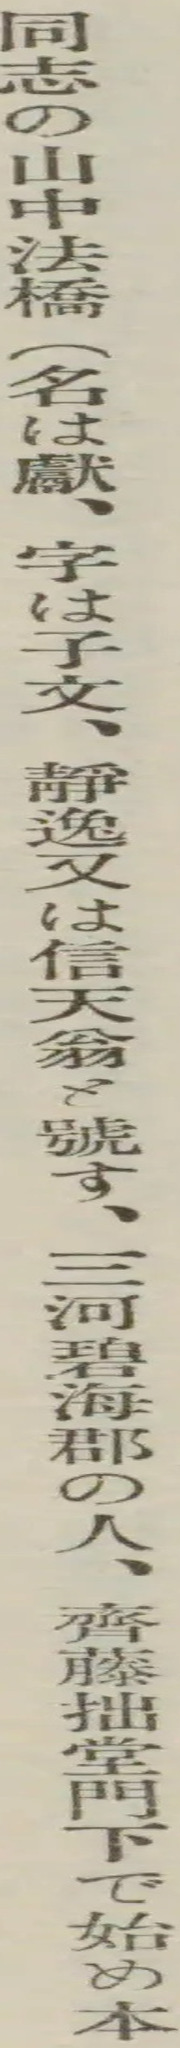同志の山中法橋(名は獻、字は子文、靜逸又は信天翁と号す、三河碧海郡の人、齊藤拙堂門下で始め本
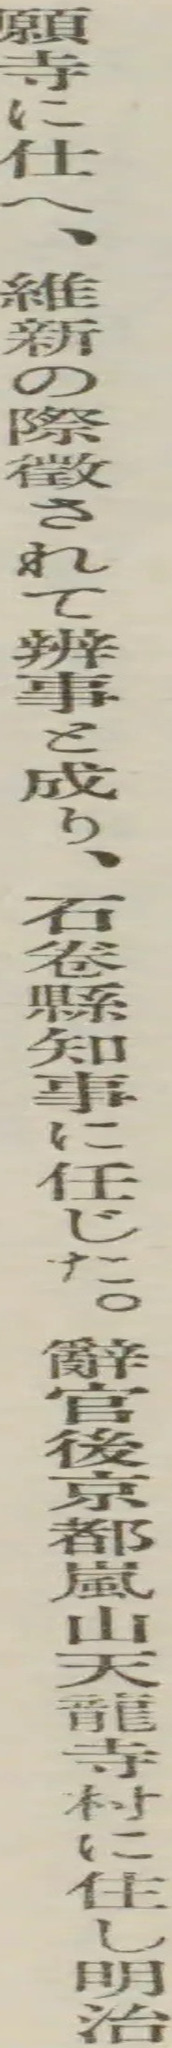願寺に仕へ、維新の際徴されて辨事と成り、石巻県知事に任じた。辞官後京都嵐山天龍寺村に住し明治
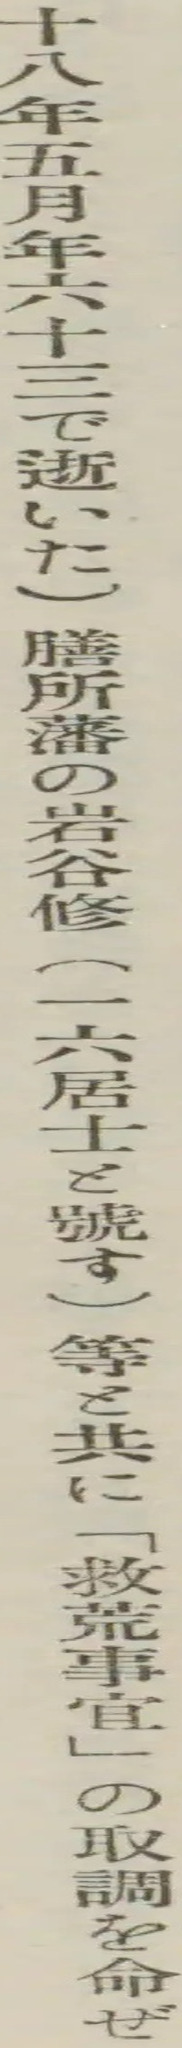十八年五月年六十三で逝いた)膳所藩の岩谷修(一六居士と号す)等と共に「救荒時宜」の取調を命ぜ
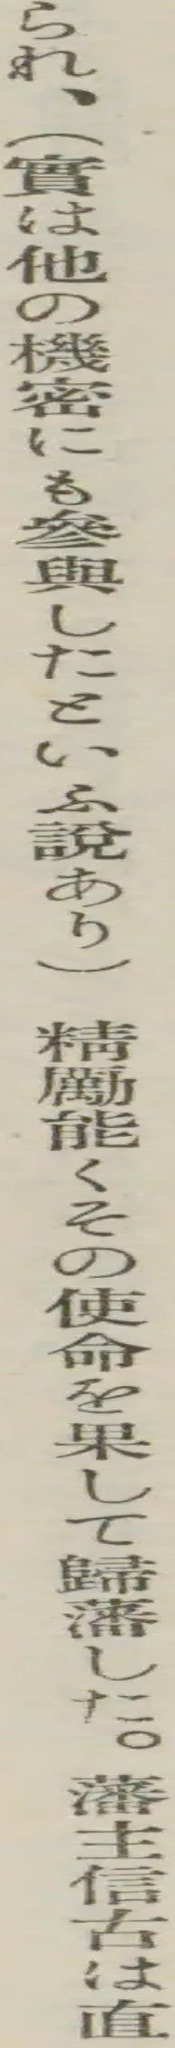られ、(実は他の機密にも参与したといふ説あり)精励能くその使命を果して帰藩した。藩主信古は直
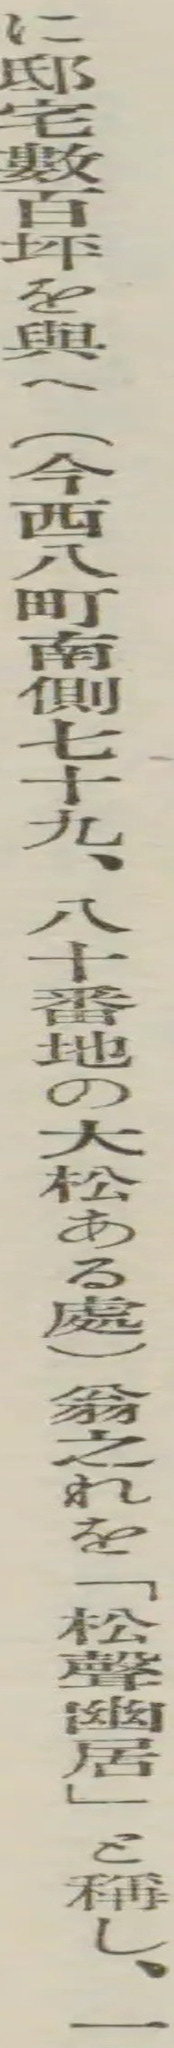に邸宅数百坪を与へ(今西八町南側七十九、八十番地の大松ある処)翁之れを「松聲幽居」と称し、一
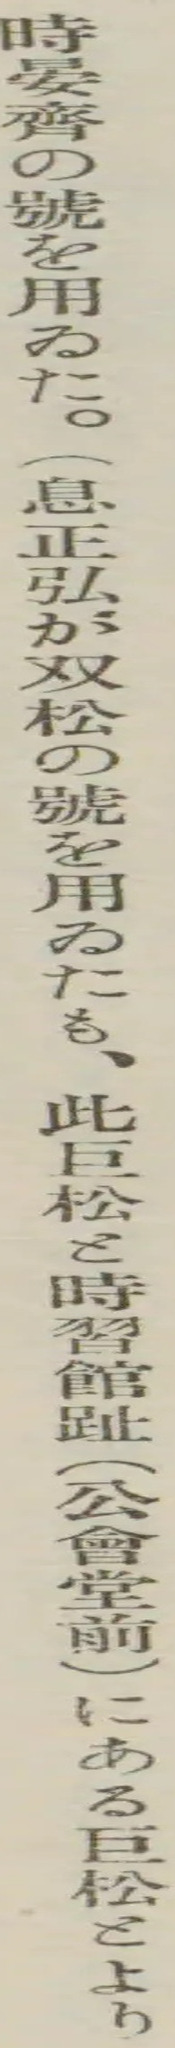時晏齊の号を用ゐた。(息正弘が双松の号を用ゐたも、此巨松と時習館趾(公会堂前)にある巨松とより
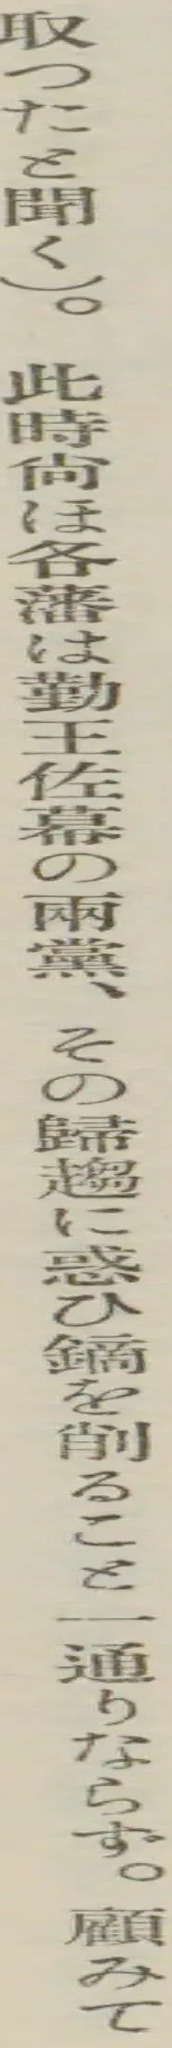取つたと聞く)。此時尚ほ各藩は勤王佐幕の両党、その帰趨に惑ひ鏑を削ること一通りならず。顧みて
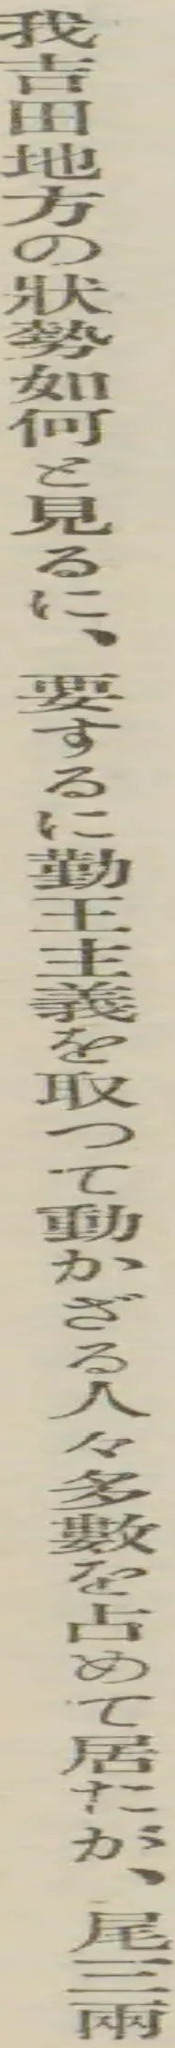我吉田地方の状勢如何と見るに、要するに勤王主義を取つて動かざる人々多数を占めて居たが、尾三両

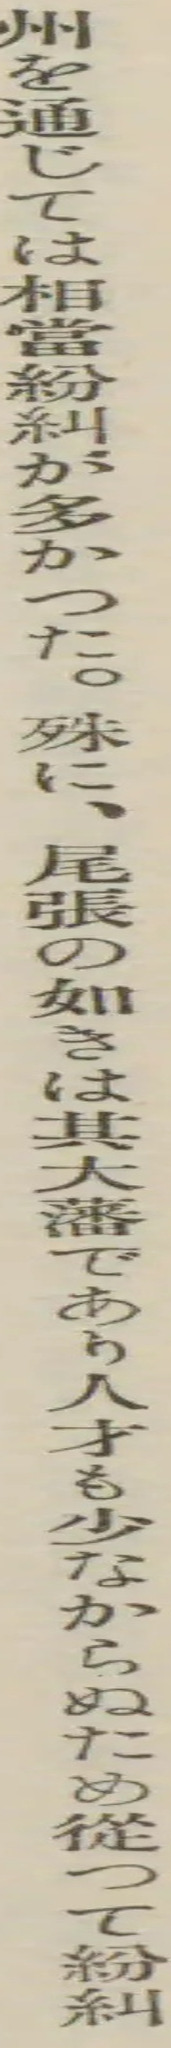州を通じては相当紛糾が多かつた。殊に、尾張の如きは其大藩であり人才も少なからぬため従つて紛糾
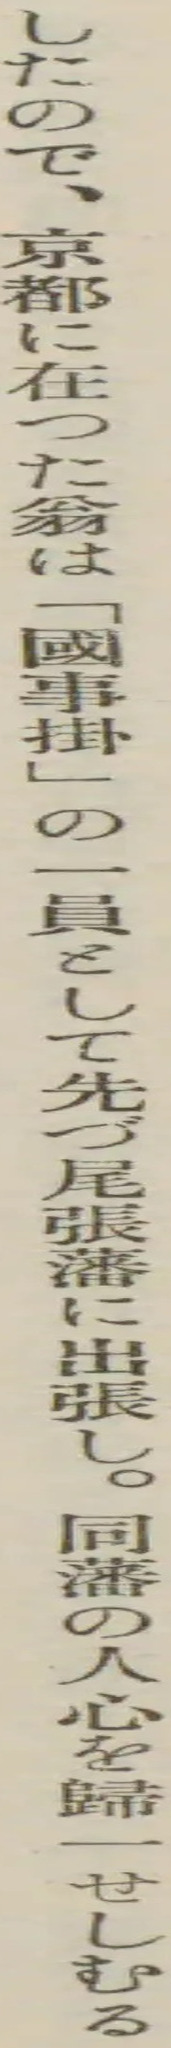したので、京都に在つた翁は「国事掛」の一員として先づ尾張藩に出張し。同藩の人心を帰一せしむる
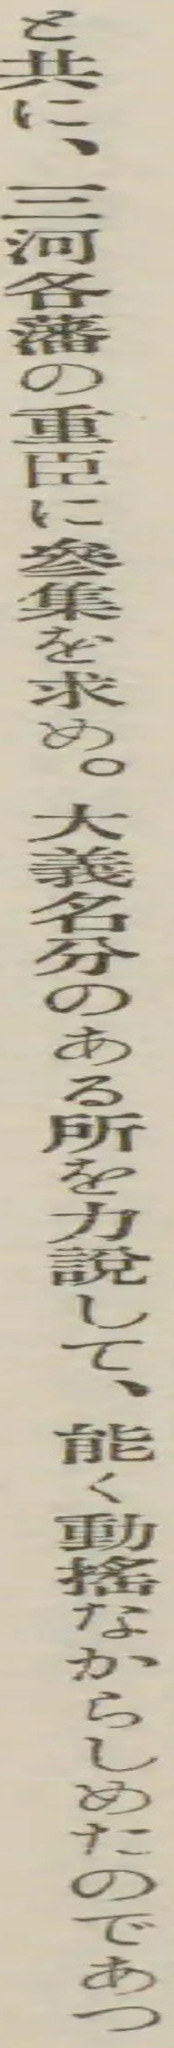と共に、三河各藩の重臣に参集を求め。大義名分のある所を力説して、能く動揺なからしめたのであつ
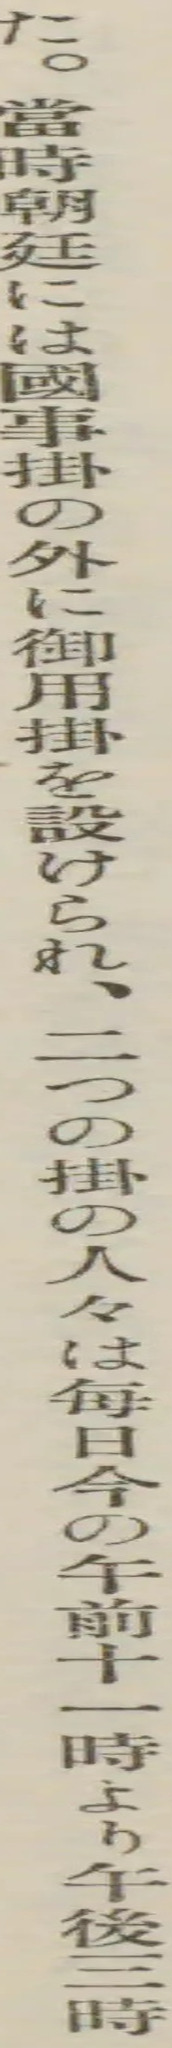た。当時朝廷には国事掛の外に御用掛を設けられ、二つの掛の人々は毎日今の御前十一時より午後三時
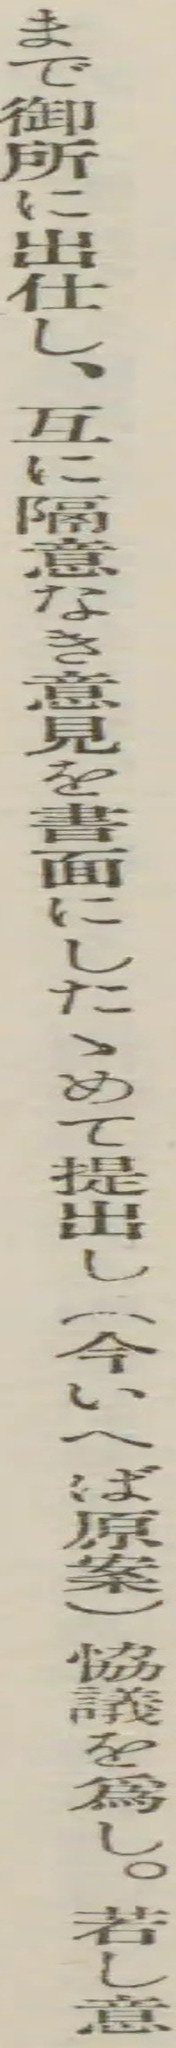まで御所に出仕し、互に隔意なき意見を書面にしたゝめて提出し(今いへば原案)協議を為し。若し意
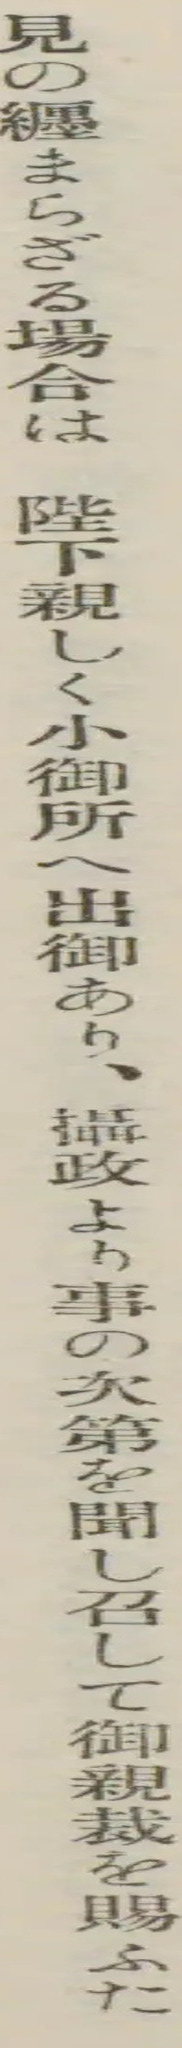見の纏らざる場合は、陛下親しく小御所へ出御あり、摂政より事の次第を聞し召して御親裁を賜ふた
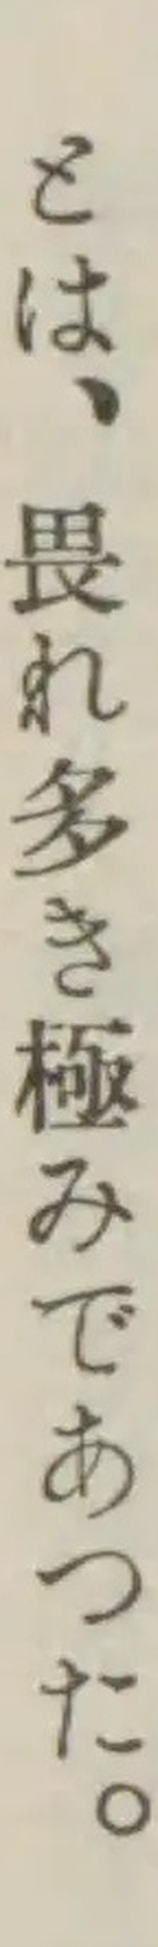とは、畏れ多き極みであつた。
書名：小野湖山翁小伝
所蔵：国立国会図書館 National Diet Library, JAPAN
